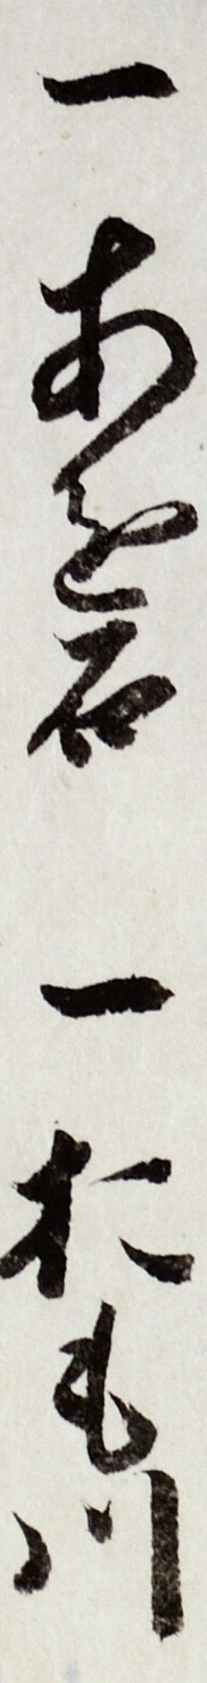一あを石一おも川
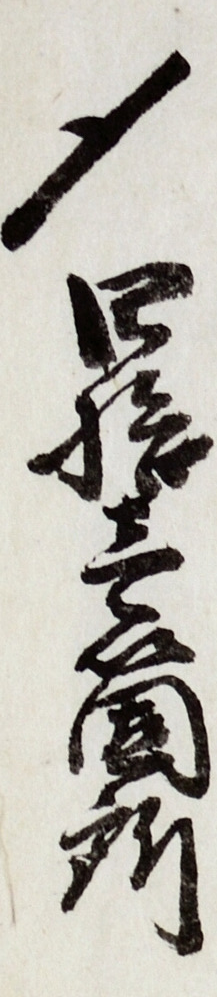〆四拾壱箇所

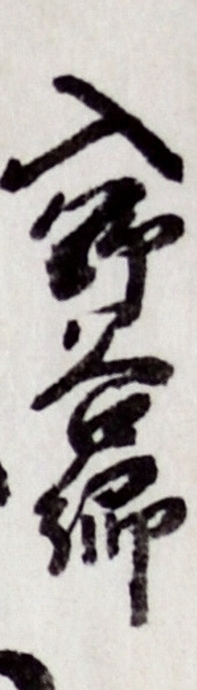入野谷郷
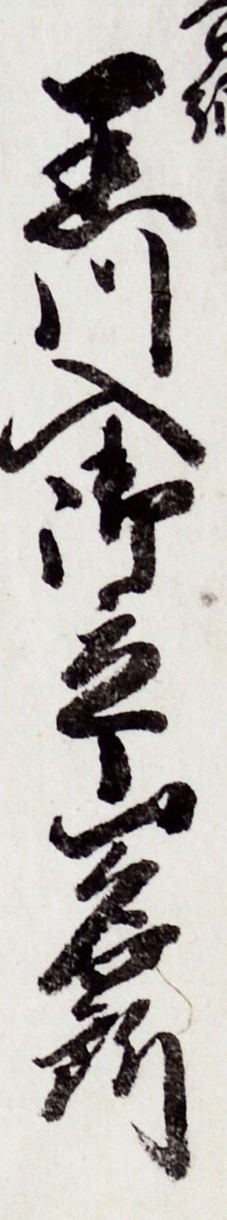黒川入御立山名所
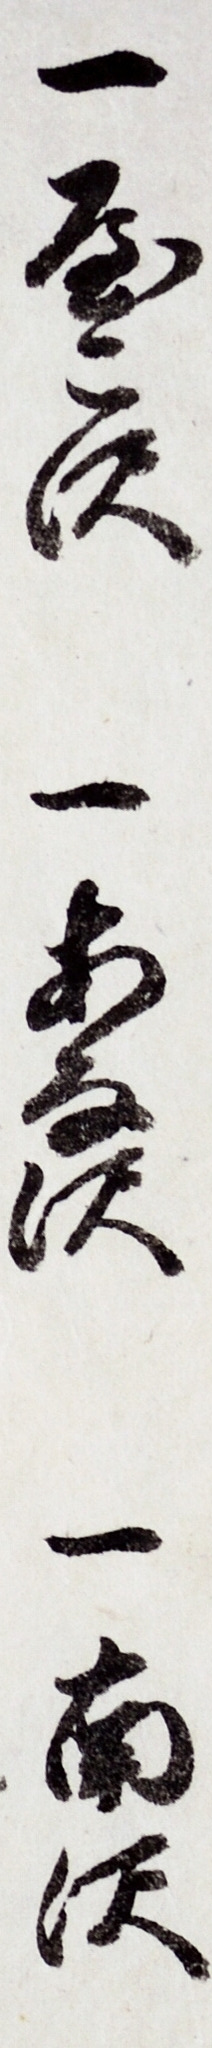一やこ沢一あな沢一南沢
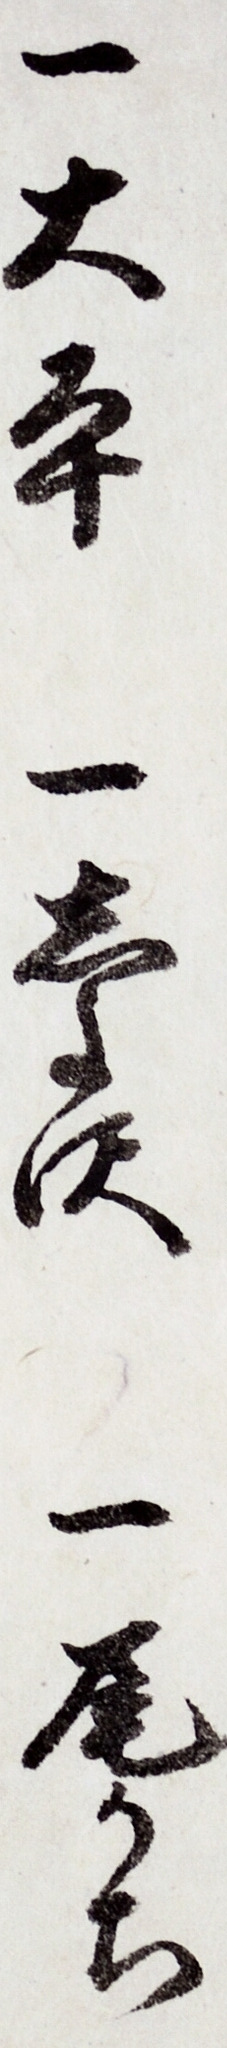一大平一しよ沢一尾かち
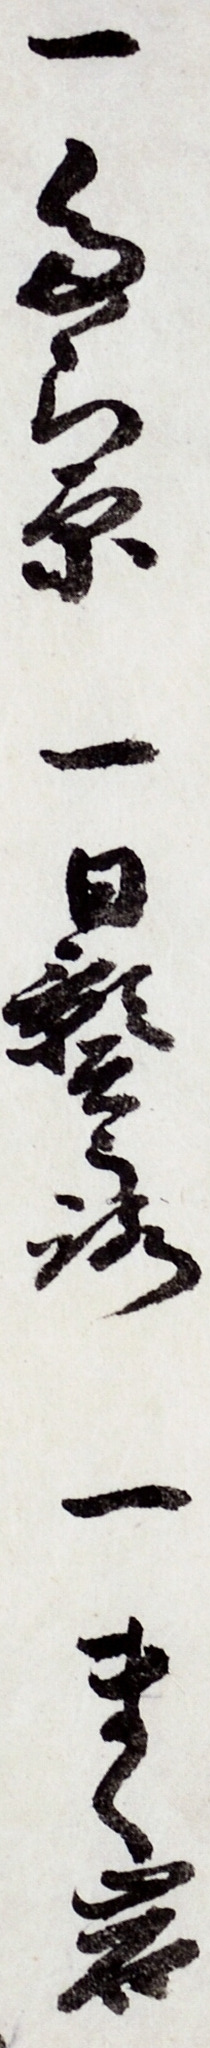一たら原一日影そうろ一まく岩
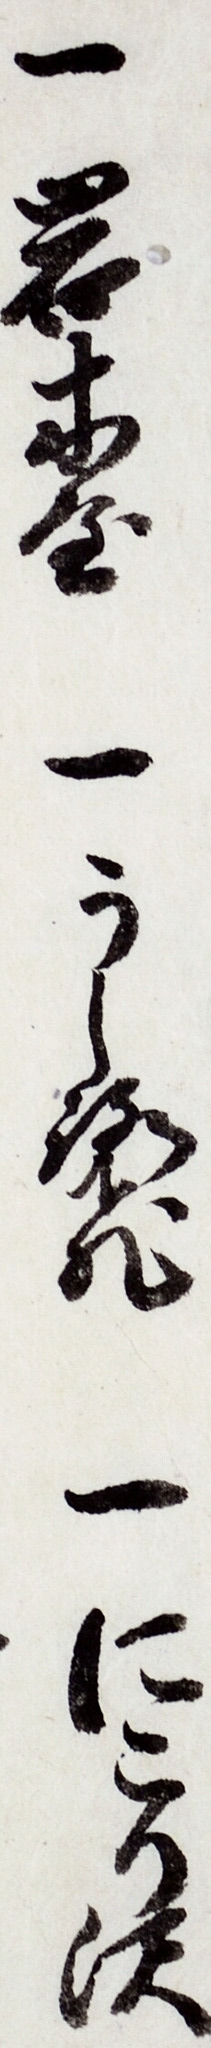一岩木屋一うしろひ一にこり沢
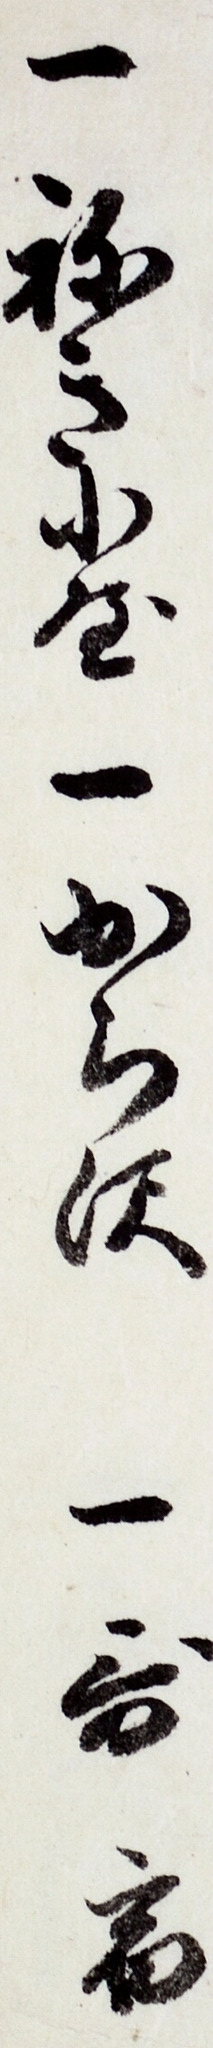一ねき小屋一から沢一哥宿
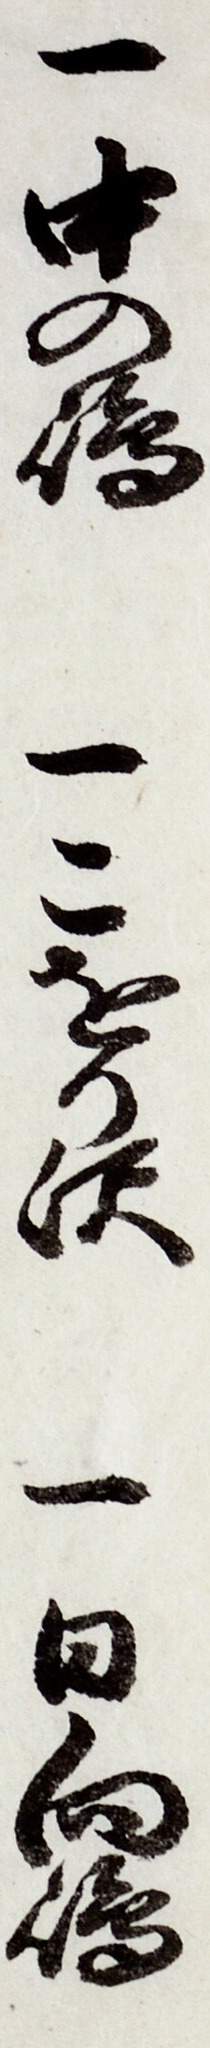一中の嶋一こをり沢一日向嶋
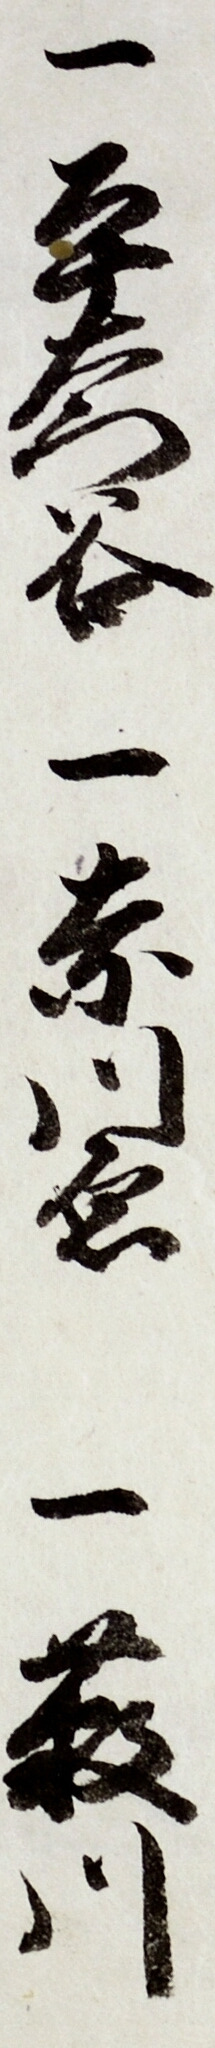一平右衛門谷一赤川原一薮川
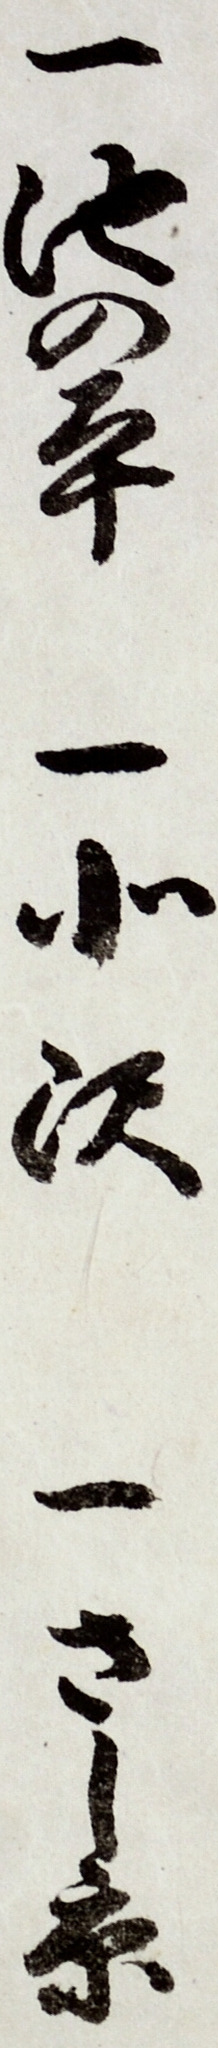一池の平一北沢一さし原
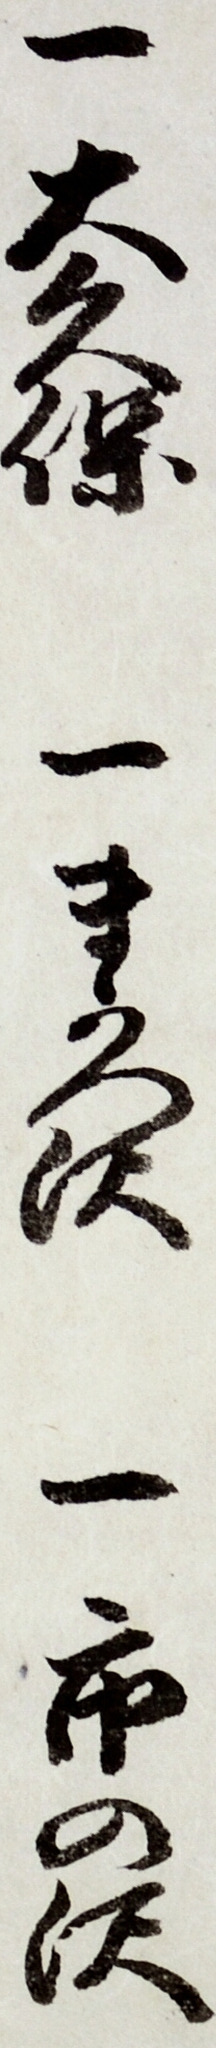一大久保一まかつ沢一市の沢
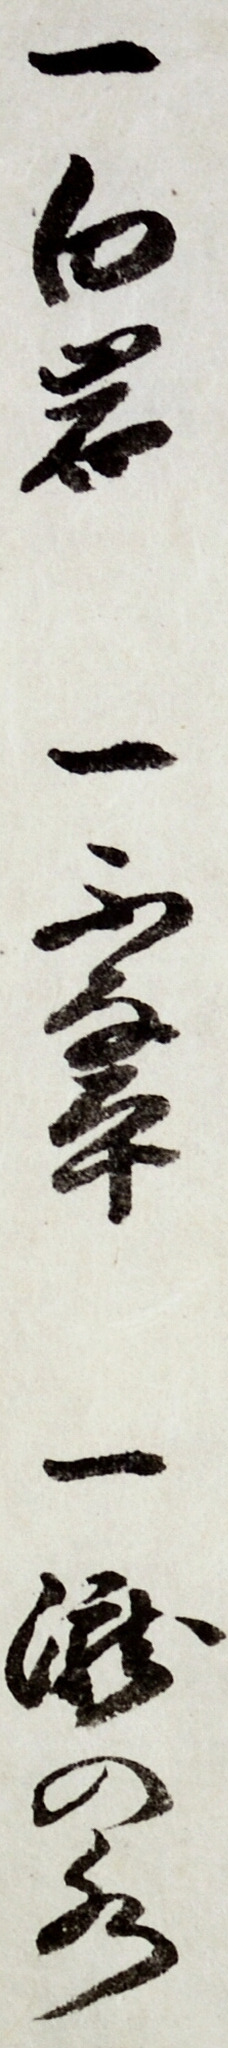一白岩一ふな平一瀧の水
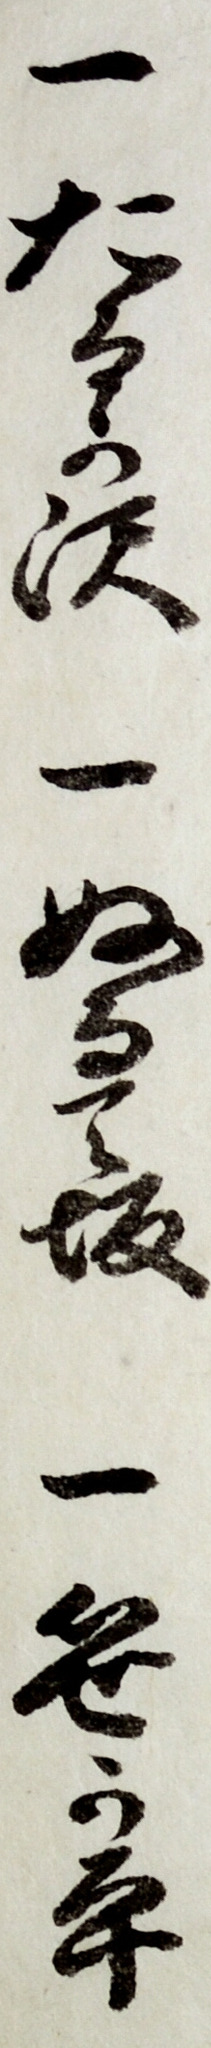一たるか沢一ぬるて坂一笹か平

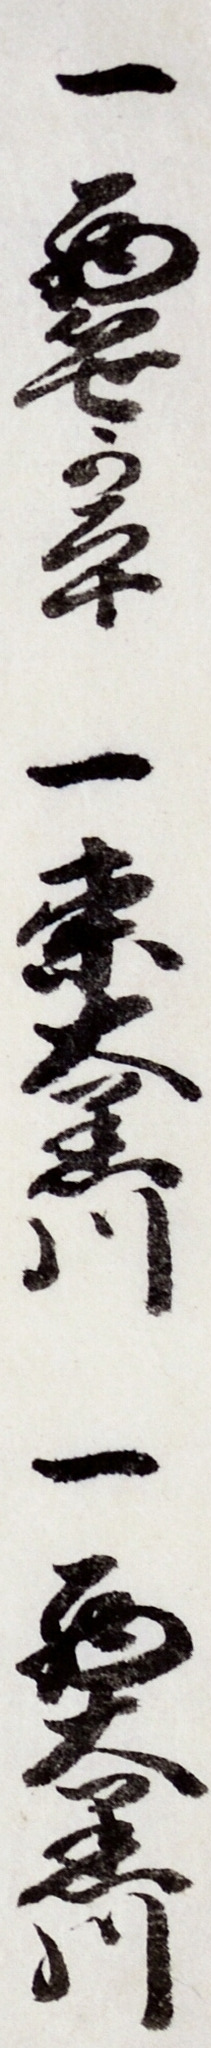一西笹か平一東大黒川一西大黒川
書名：御領分御立山名所帳
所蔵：伊那市立高遠町図書館・合同会社AMANE
